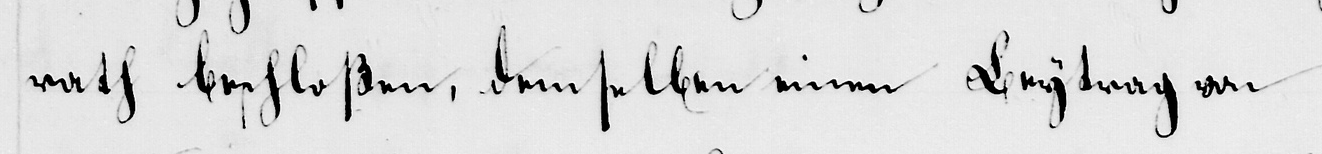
rath beschloßen, demselben einen Beytrag von
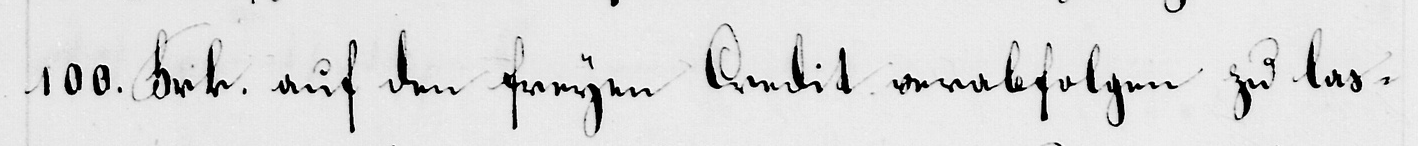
100. Frk. auf den freyen Credit verabfolgen zu las¬
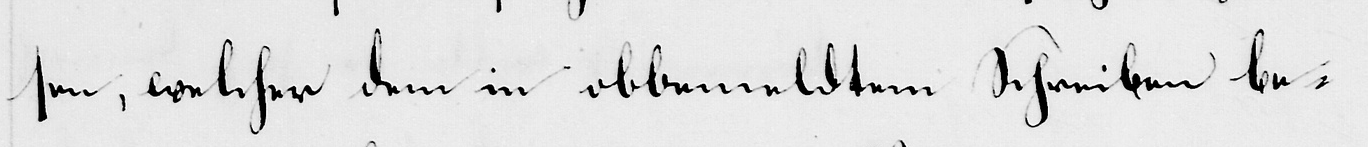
sen, welcher dem in obbemeldtem Schreiben be¬
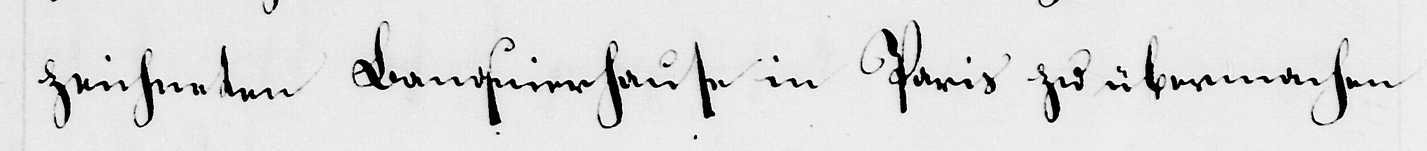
zeichneten Banquierhause in Paris zu übermachen
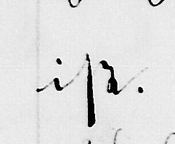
ist.
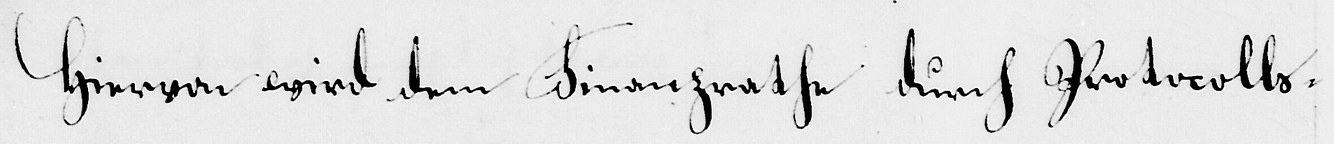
Hiervon wird dem Finanzrathe durch Protocolls¬
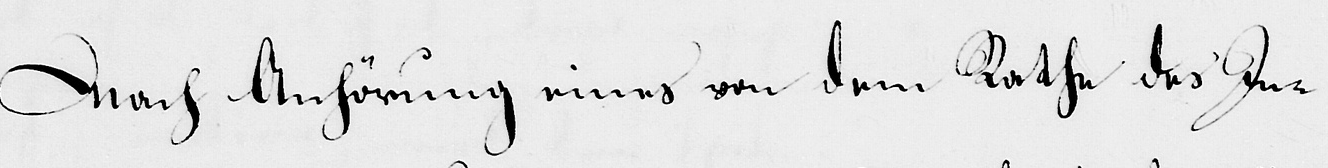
Nach Anhörung eines von dem Rathe des In¬
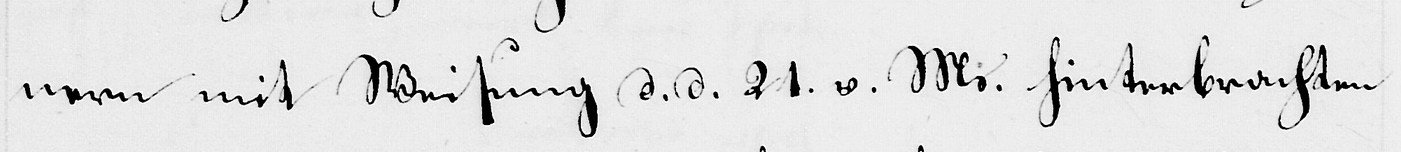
nern mit Weisung d. d. 21. v. Ms. hinterbrachten
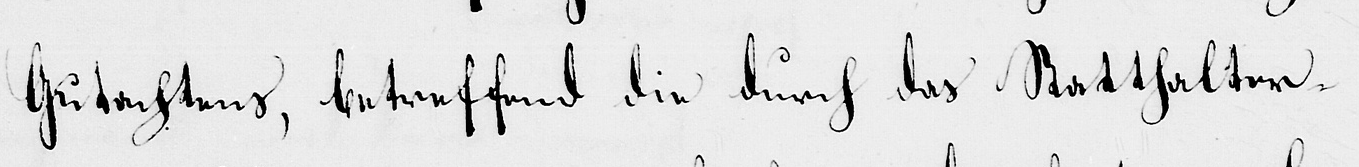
Gutachtens, betreffend die durch das Statthalter¬
